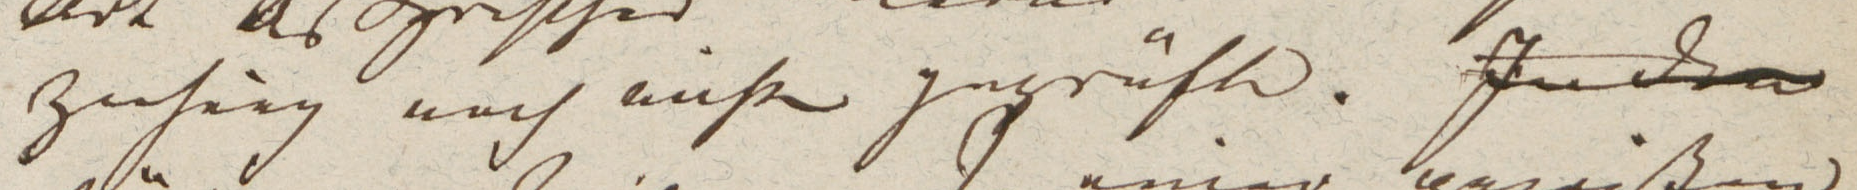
ziehung noch nicht geprüft. In den
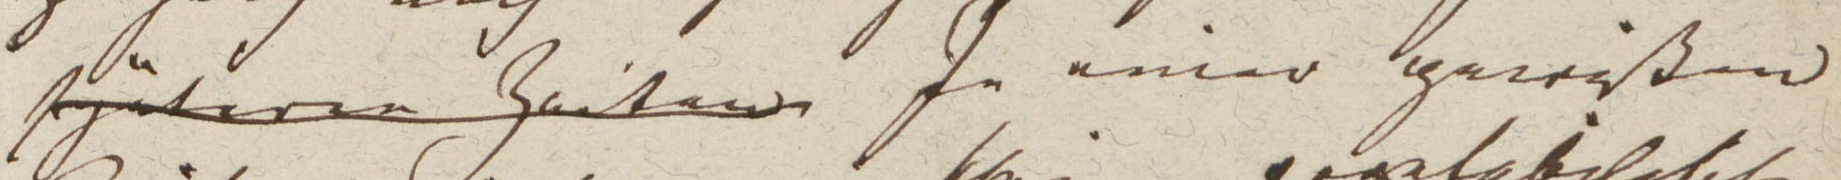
späteren Zeiten In einer gewissen
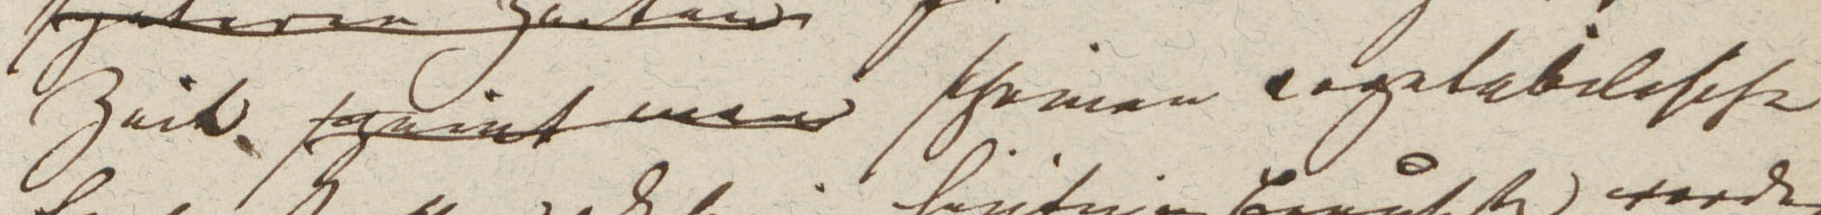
Zeit scheint man scheinen vegetabilische
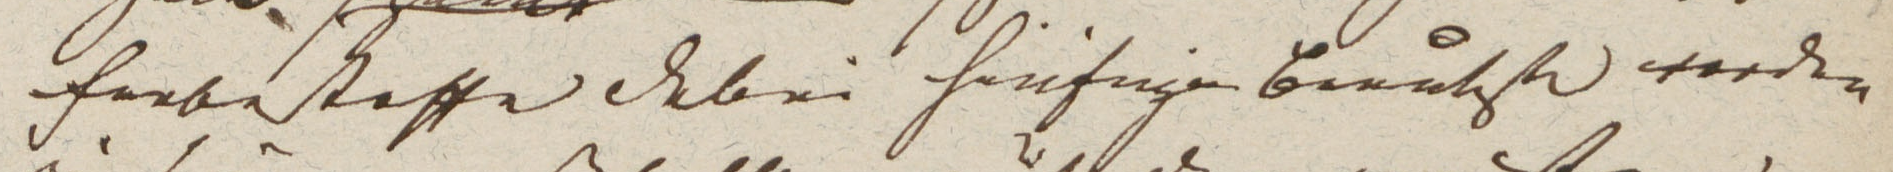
Farbstoffe dabei häufig bentzt worden
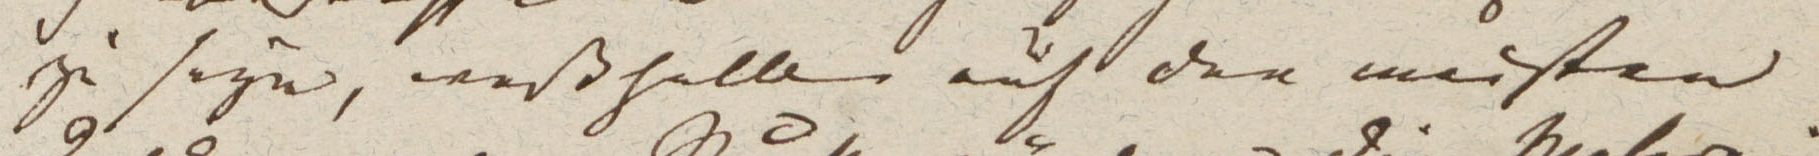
zu seyn, wesshalb auf den meisten
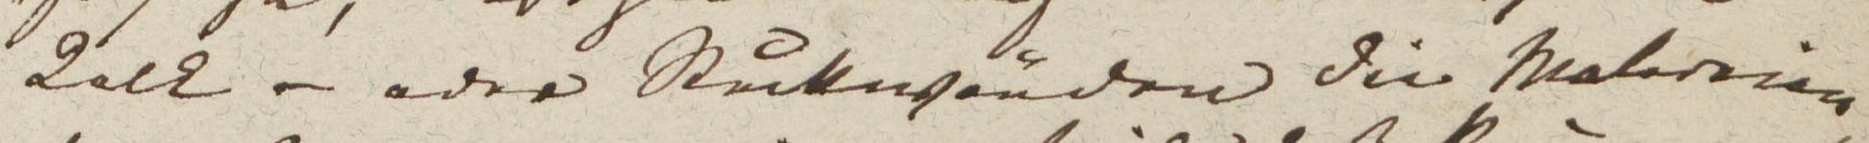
Kalk- oder Stuckwänden die Malereien
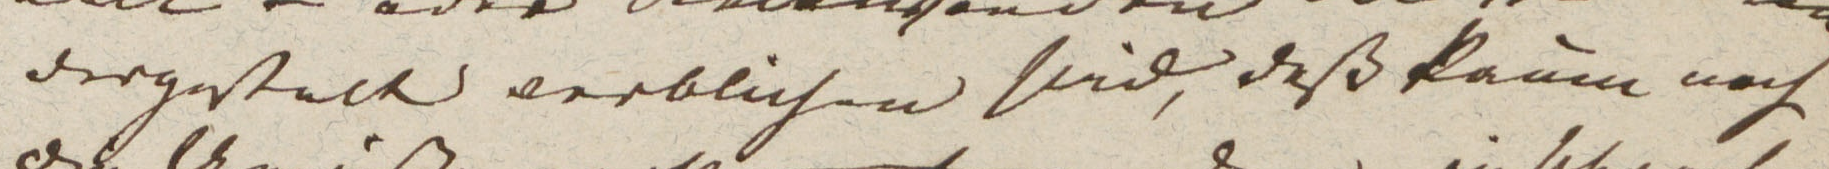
dergestalt verblichen sind, dass kaum noch
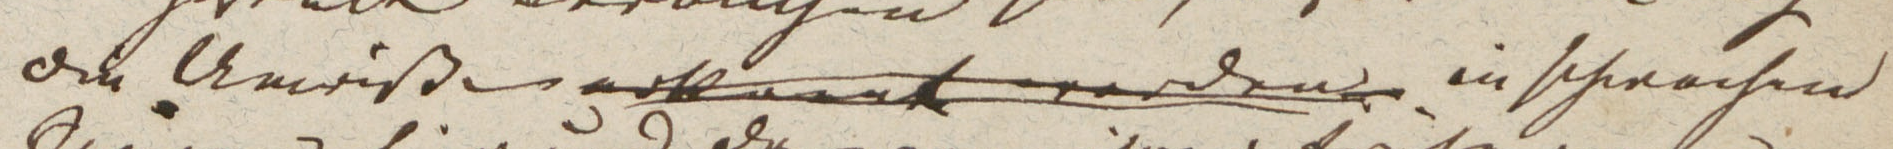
die Umrisse erkannt wrden in schwachen
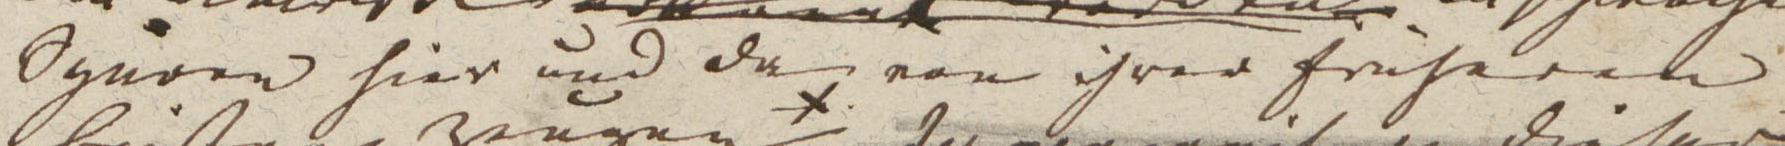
Spuren hier und da von ihrer früheren
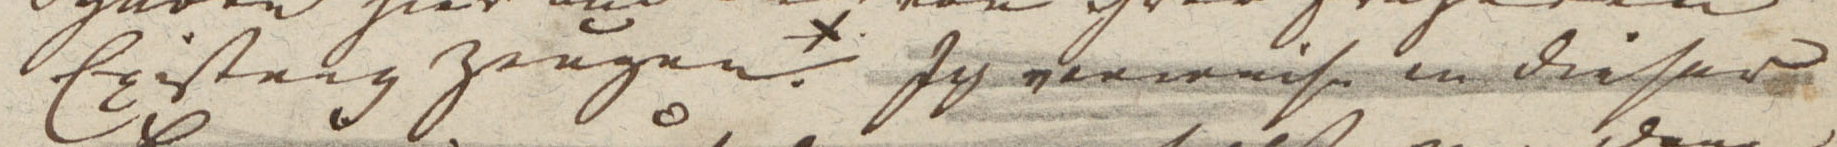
Existenz zeugen. % Ich verweise in dieser
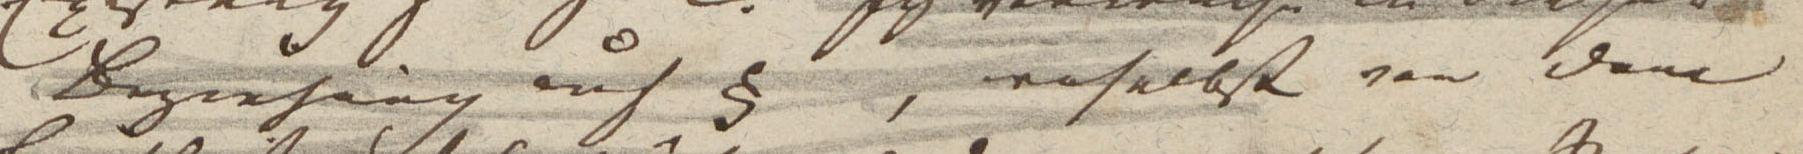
Beziehung auf § , woselbst von dem
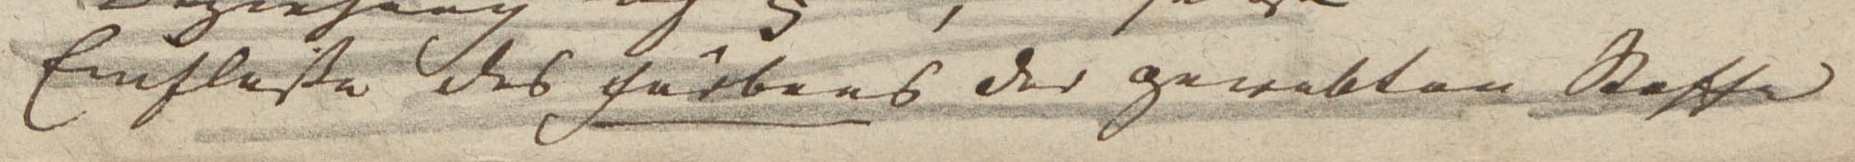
Einflusse des Färbens der gewebten Stoffe
